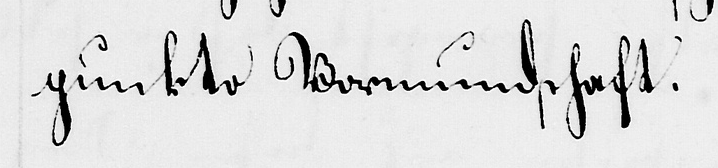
punkto Vormundschaft.
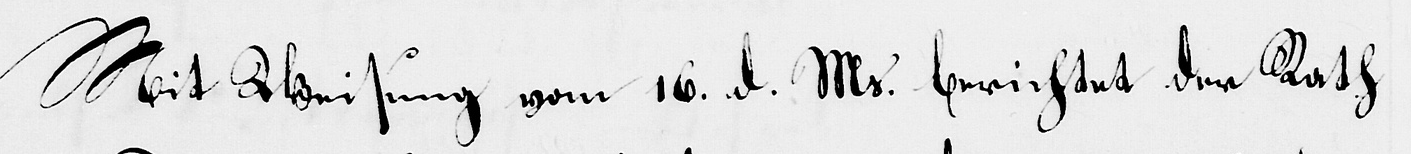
Mit Weisung vom 16. d. Ms. berichtet der Rath
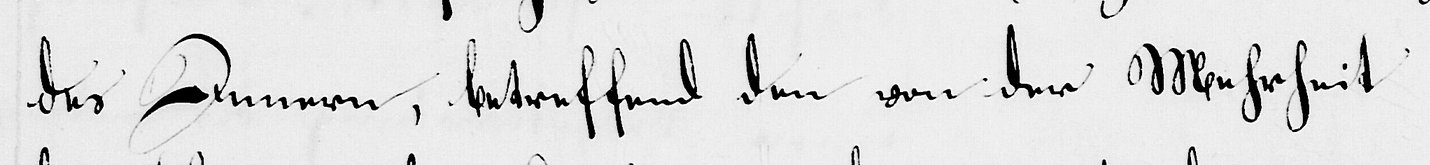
des Innern, betreffend den von der Mehrheit
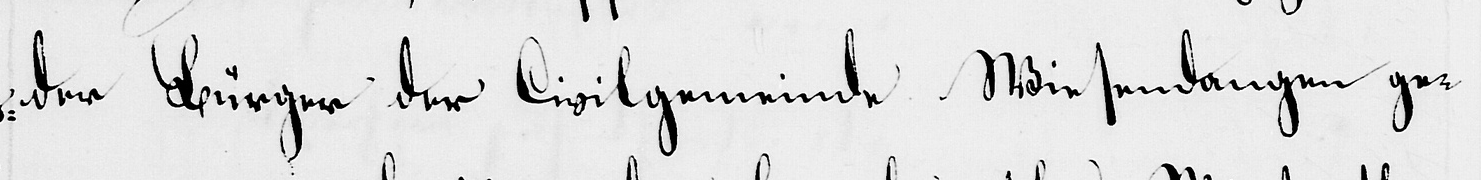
der Bürger der Civilgemeinde Wiesendangen ge¬
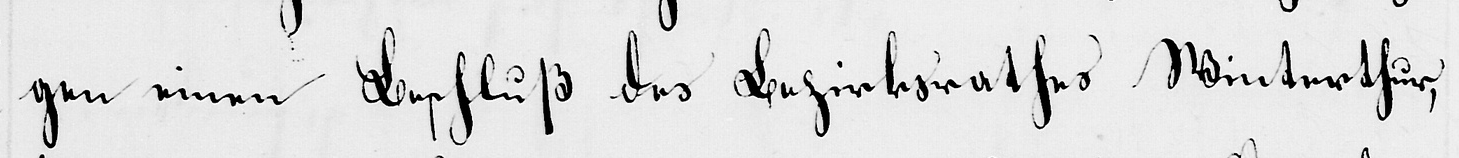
gen einen Beschluß des Bezirksrathes Winterthur,
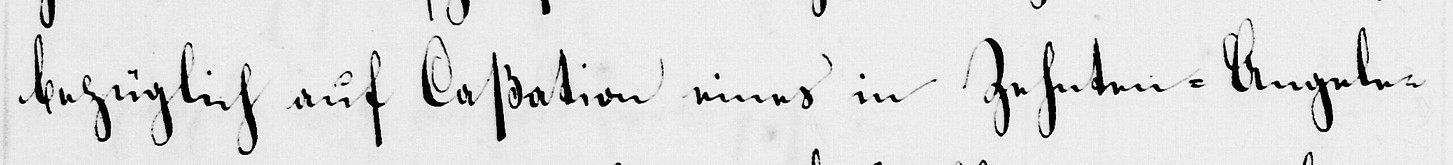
bezüglich auf Caßation eines in Zehnten-Angele¬
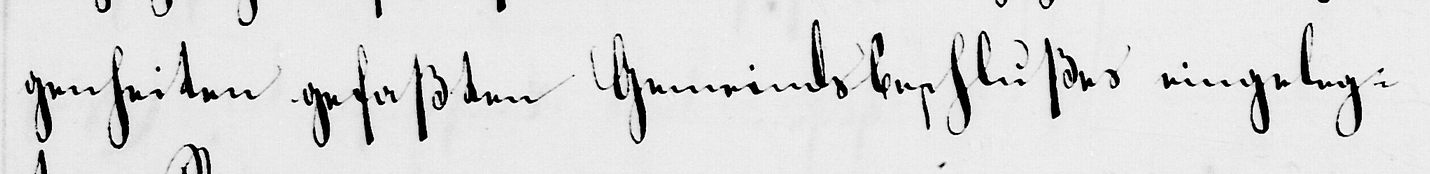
genheiten gefaßten Gemeindsbeschlußes eingeleg¬
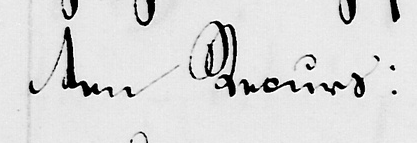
ten Recurs:
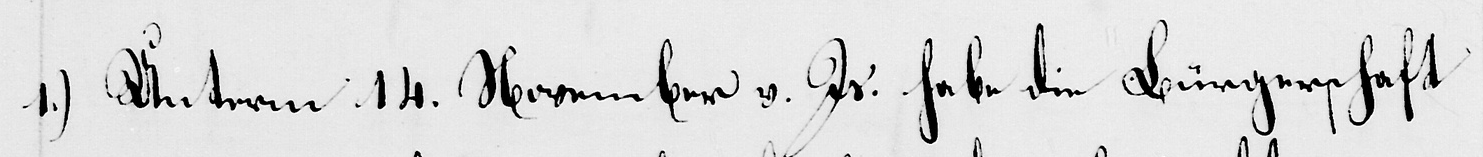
1.) Unterm 14. November v. Js. habe die Bürgerschaft
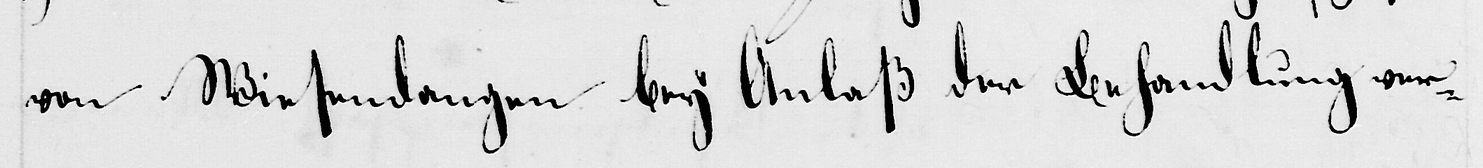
von Wiesendangen bey Anlaß der Behandlung ver-
